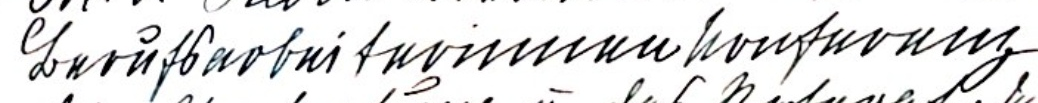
Berufsarbeiterinnenkonferenz
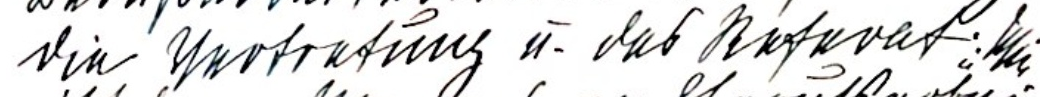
den Vertretung u, das Referat: „Wie
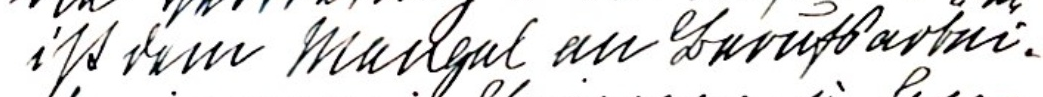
ist dem Mangel an Berufsarbei
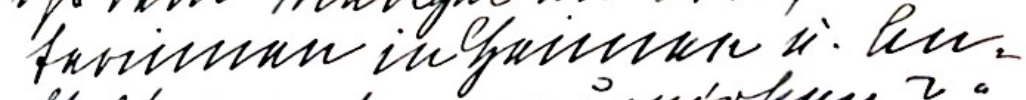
terinnen in Heimen u. An
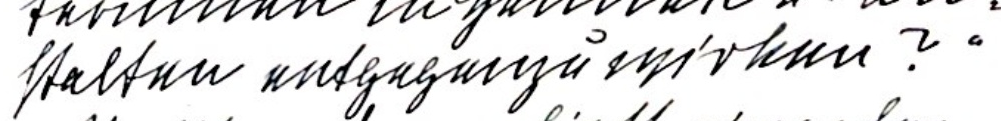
stalten entgegenzuwirken?"
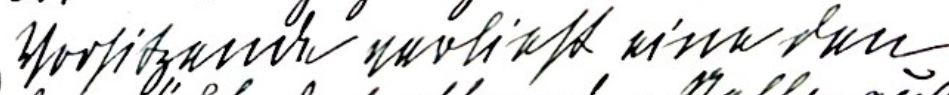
Vorsitzende verließt eine den
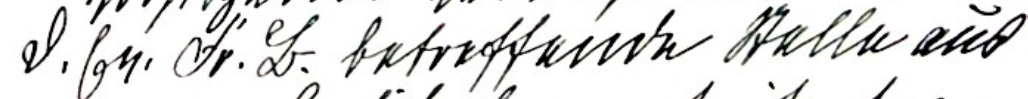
D. Ev. Fr. B. betreffende Stelle aus
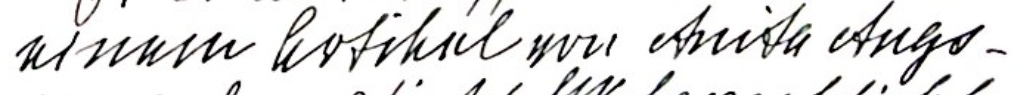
einem Artikel von Anita Augs-
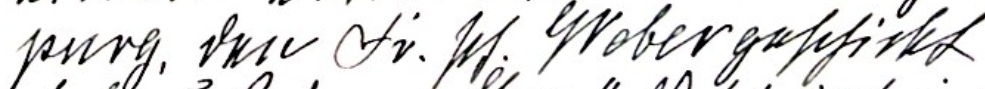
purg, den Fr. Pf. Weber geschickt
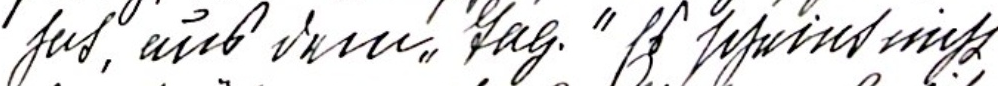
hat, aus dem „Tag" Es scheint nicht
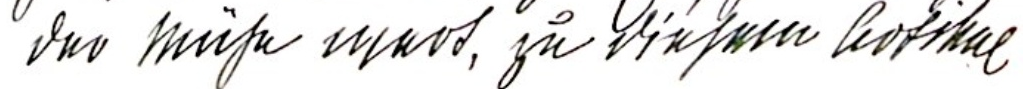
der Mühe wert, zu diesem Artikel
